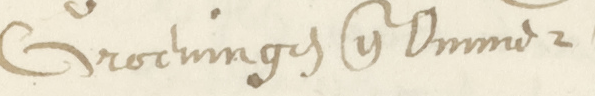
Groeningen & Omme„
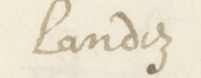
Landen
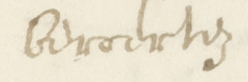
beroerten
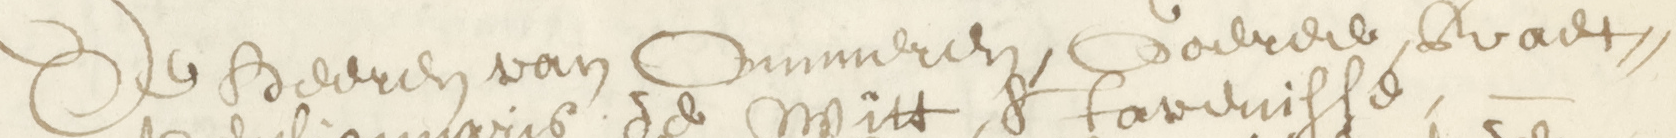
D'Heeren van Ommeren, Goeree, Raet„
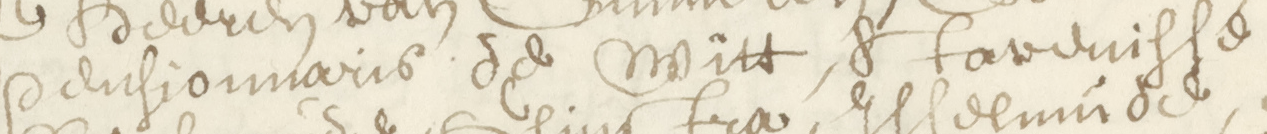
Pensionnaris de Witt, Stavenisse,
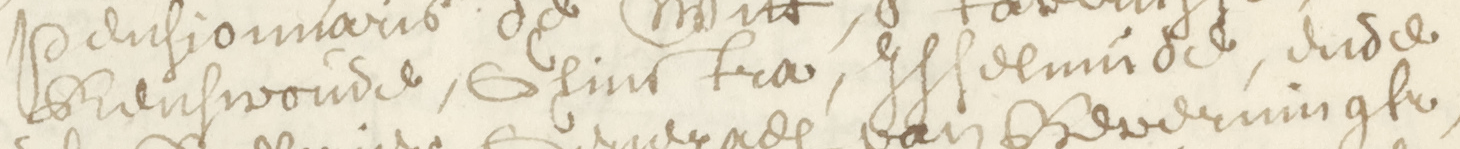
Renswoude, Glinstra, Isselmude ende
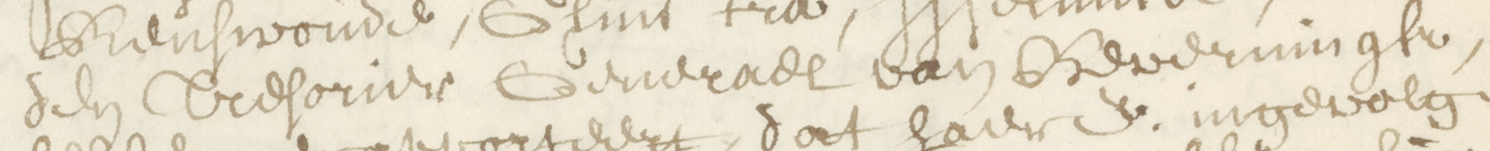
den Tresorier Generael van Beverningk,
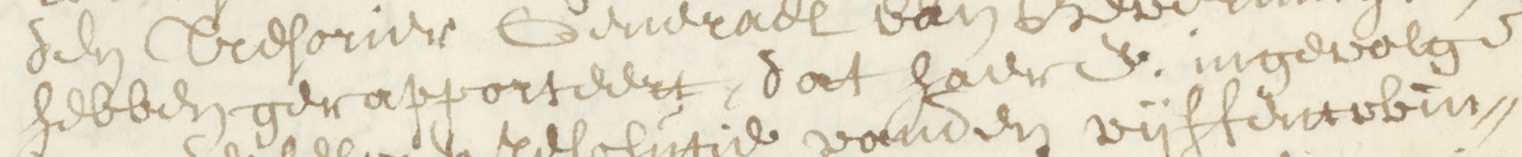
hebben gerapporteert, dat haer E. ingevolge
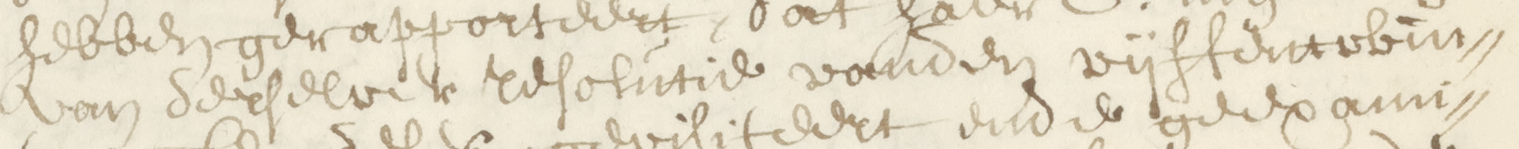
van derselver resolutie vanden vijffentwin„
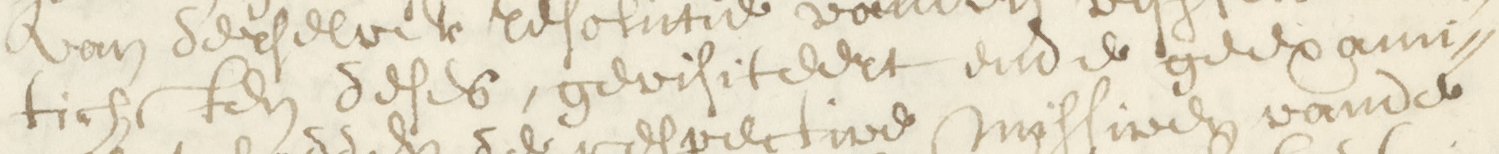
tichsten deses, gevisiteert ende geexami„
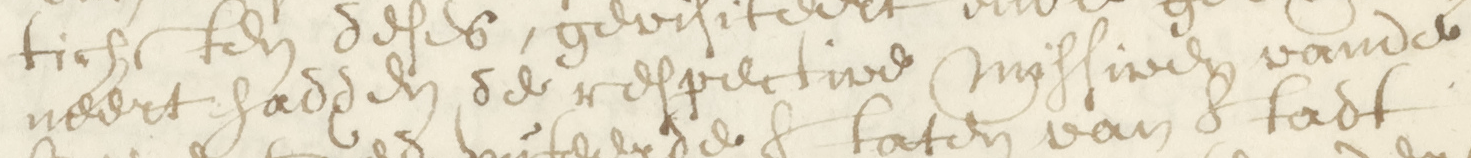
neert hadden de respective missiven vande
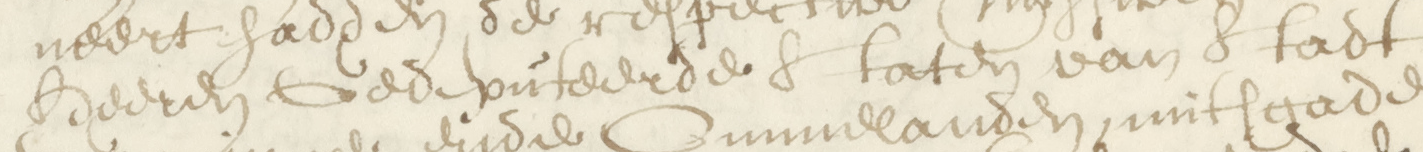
Heeren Gedeputeerde Staten van Stadt
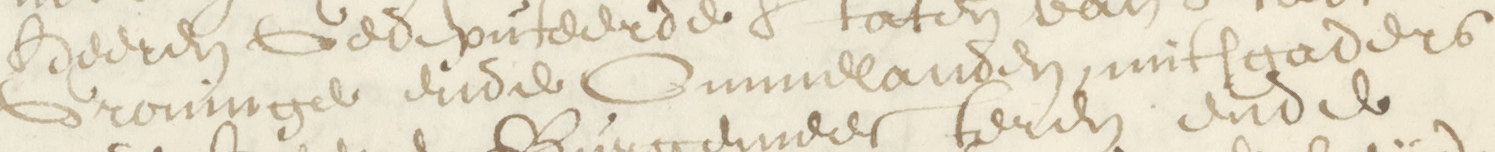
Groninge ende Ommelanden, mitsgaders
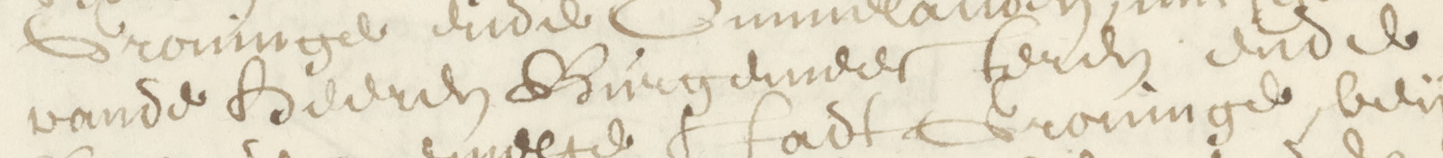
vande Heeren Burgemeesteren ende
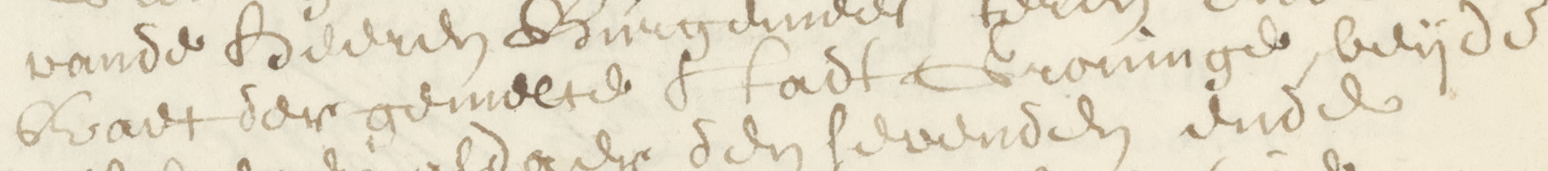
Raet der gemelte Stadt Groninge beijde
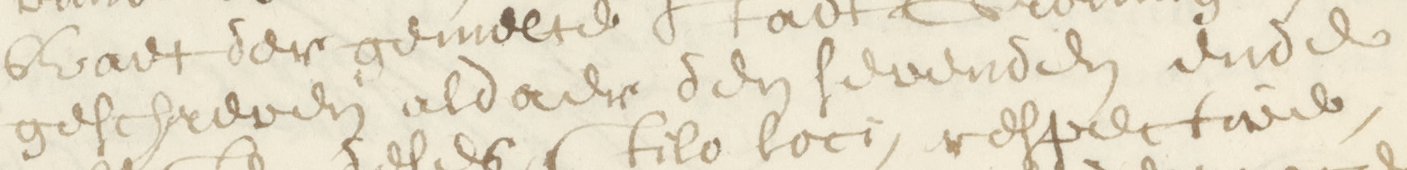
geschreven aldaer den sevenden ende
